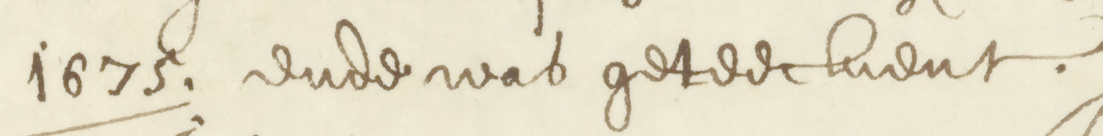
1675. ende was geteeckent.
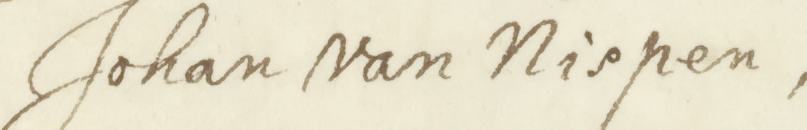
Johan van Nispen,
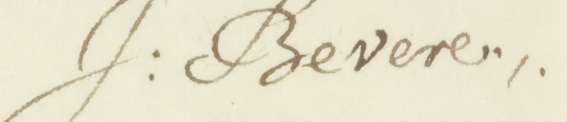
J: Bevere,
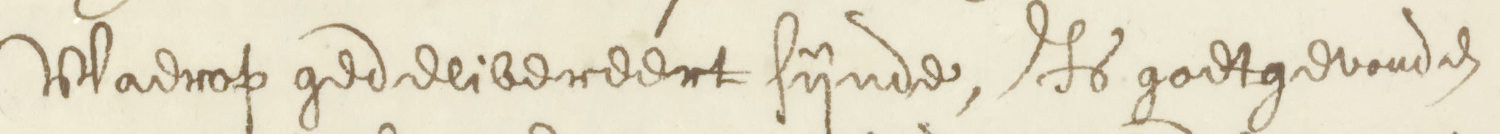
Waerop gedelibereert sijnde, Is goetgevonden
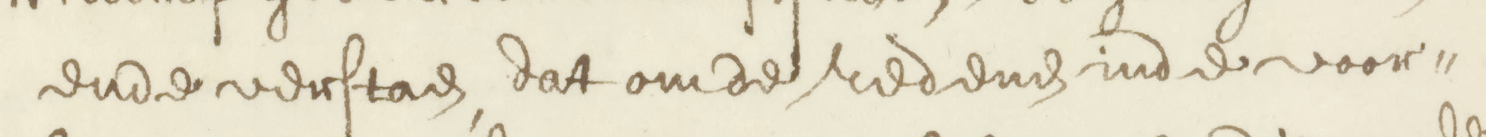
ende verstaen, dat om de redenen inde voor„
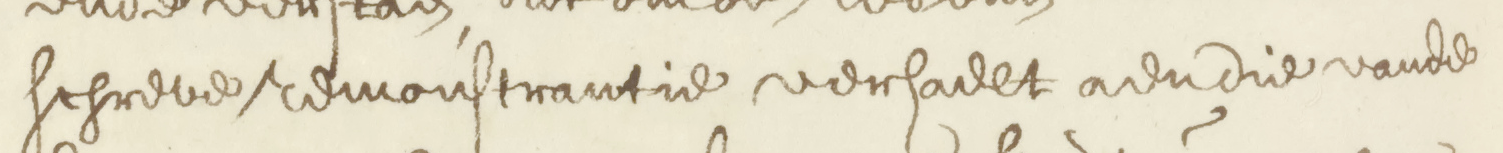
schreve remonstrantie verhaelt aen die vande
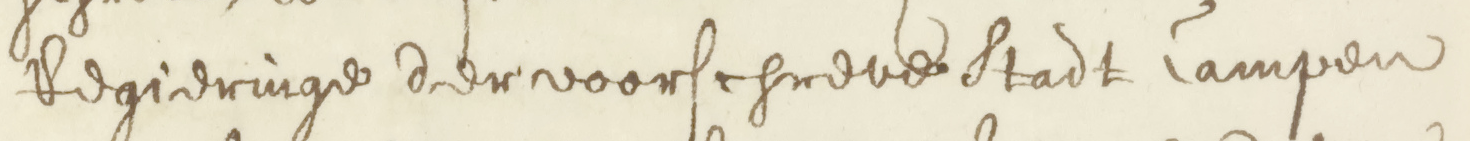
Regieringe der voorschreve stadt Campen
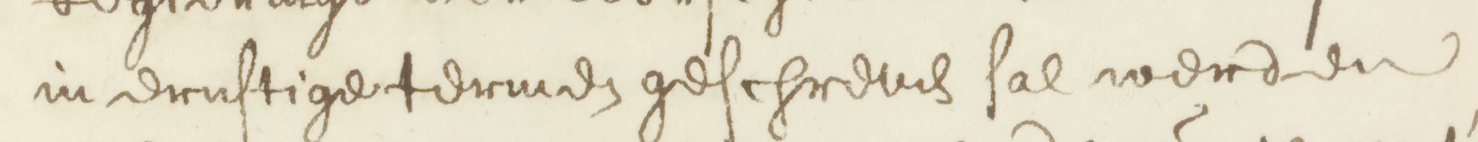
in ernstige termen geschreven sal werden
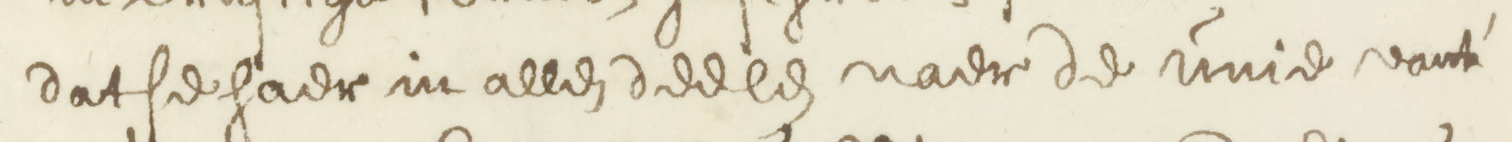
datse haer in allen deelen naer de unie vant
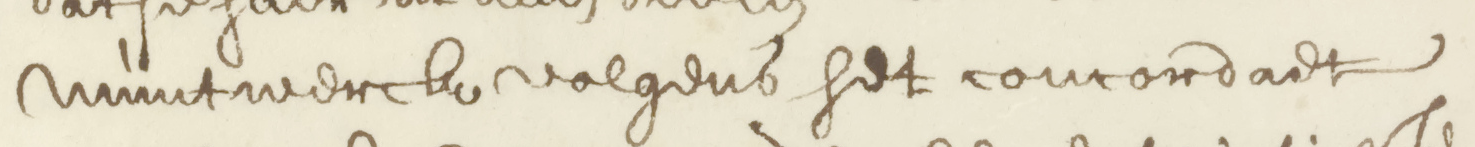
muntwerck volgens het concordaet
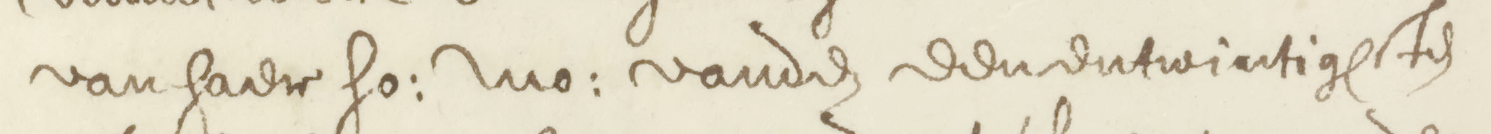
van haer Ho:Mo: vanden eenentwintighsten
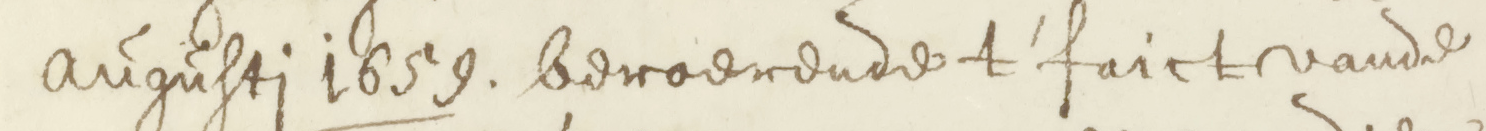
Augusti 1659. beroerende t'faict vande
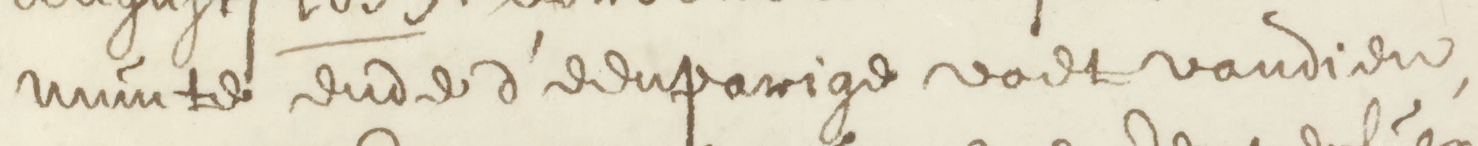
munte ende d‛eenparige voet vandien
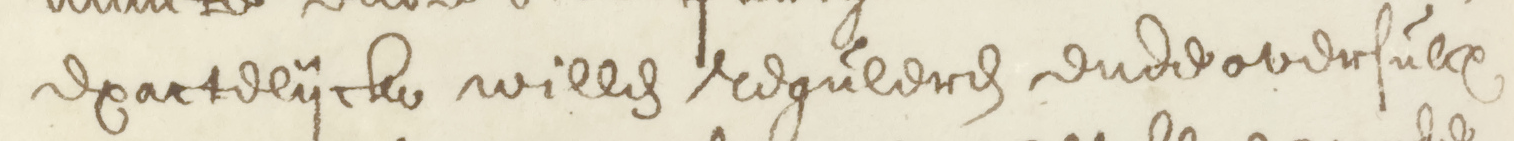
exactelijck willen reguleren, ende oversulcx
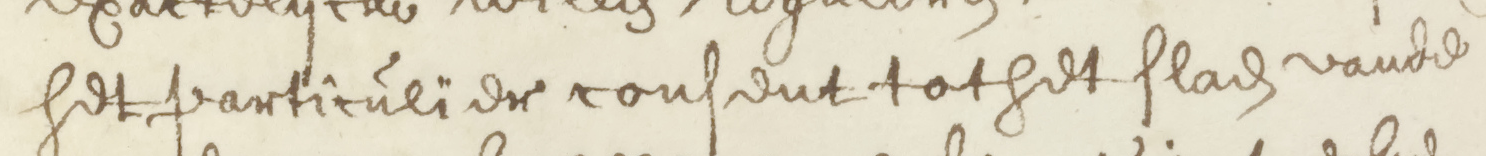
het particulier consent tot het slaen vande
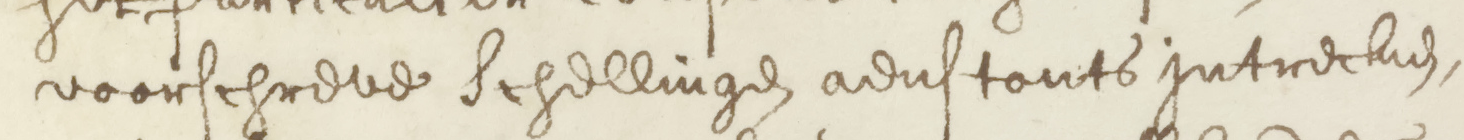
voorschreve schellingen aenstonts intrecken
